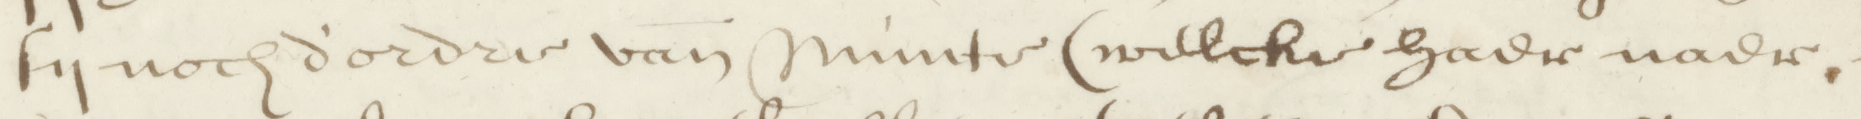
sy noch d'ordre van munte (welcke haer naer
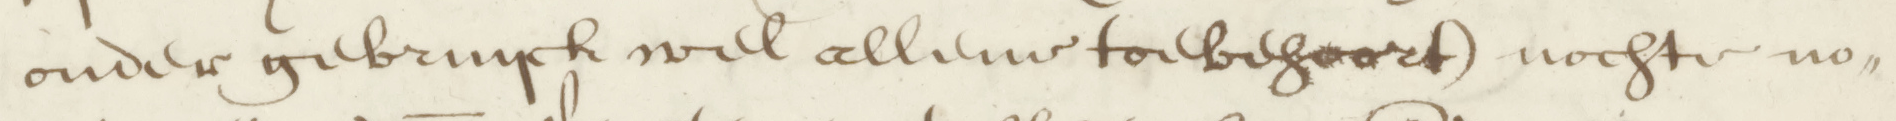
ouder gebruyck wel allene toebehoort) nochte no,,
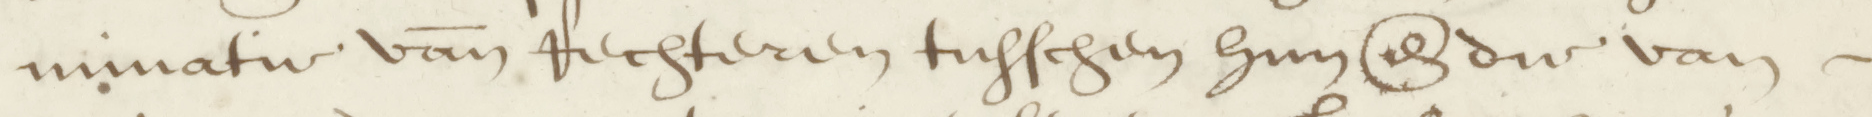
minatie van Rechteren tusschen hun & die van
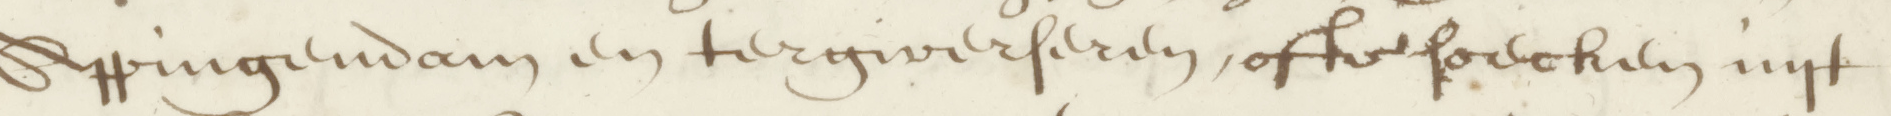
Appingedam en tergiverseren, ofte soecken uyt
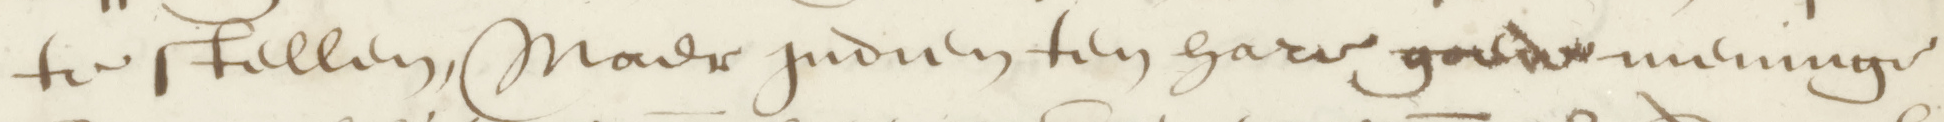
te stellen, Maer Indien ten hare goede meninge
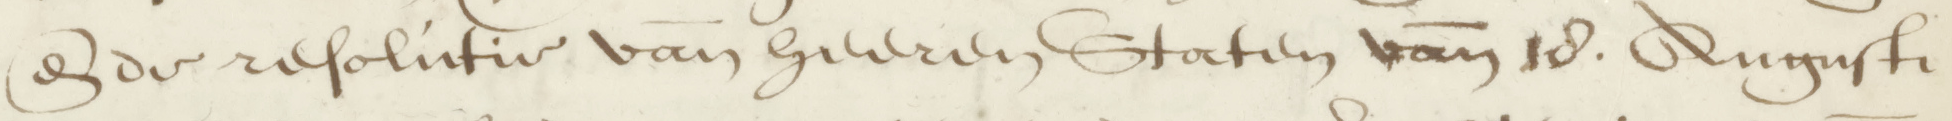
& de resolutie van heeren Staten van 18. Augusti
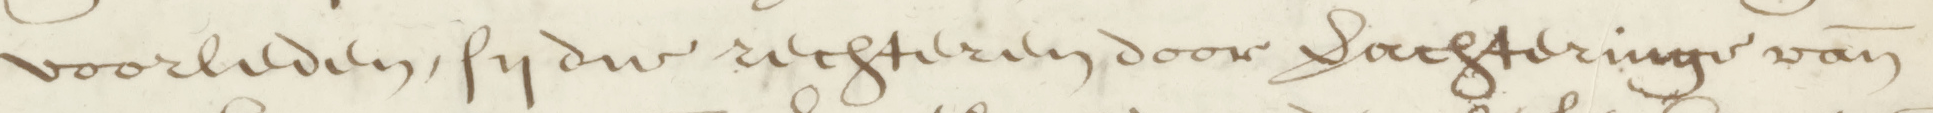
voorleden, sy die rechteren door vachteringe van
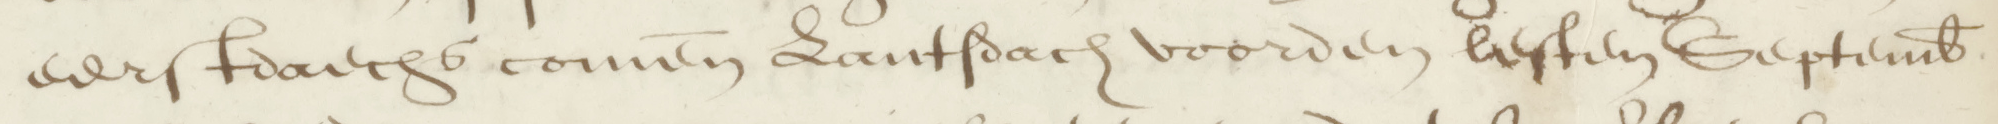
eerstdaechs comen Lantsdach voorden lesten Septemb
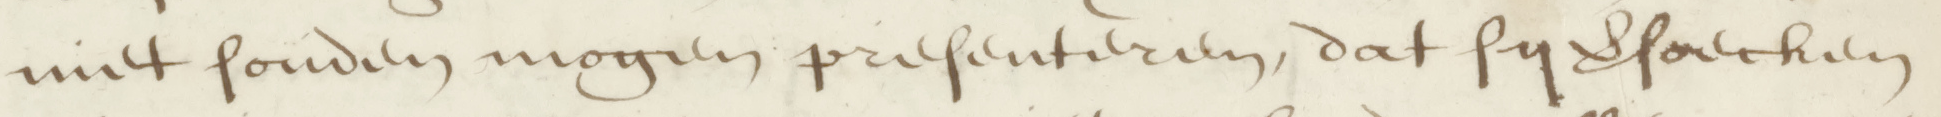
niet souden mogen presenteren, dat sy vsoecken
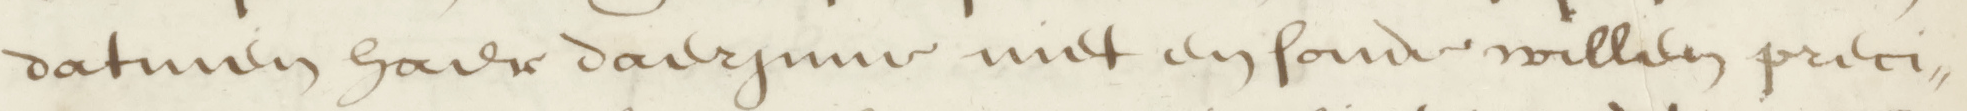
datmen haer daerinne niet en soude willen preci,,
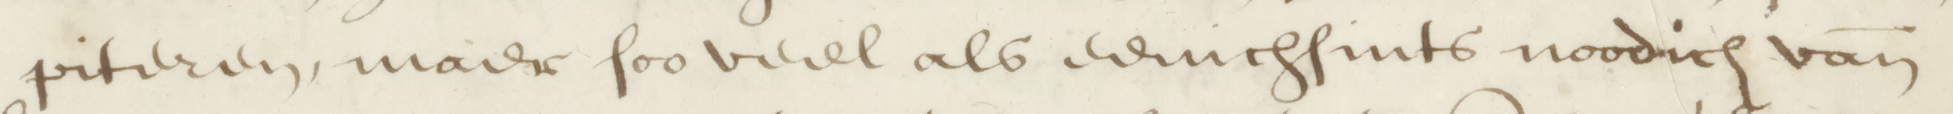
piteren, maer soo veel als eenichsints noodich van
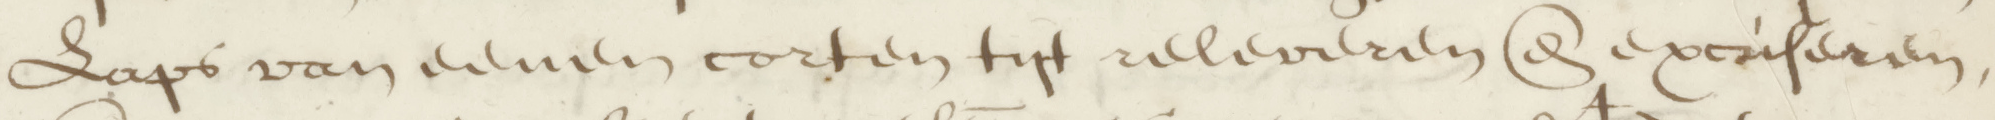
Laps van eenen corten tyt releveren & excuseren,
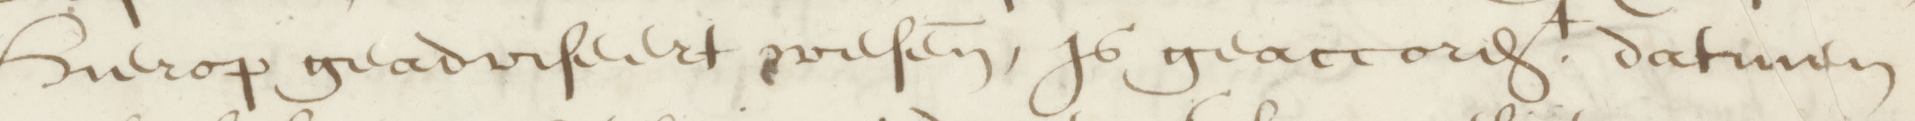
Hierop geadviseert wesen, Is geaccordt. datmen
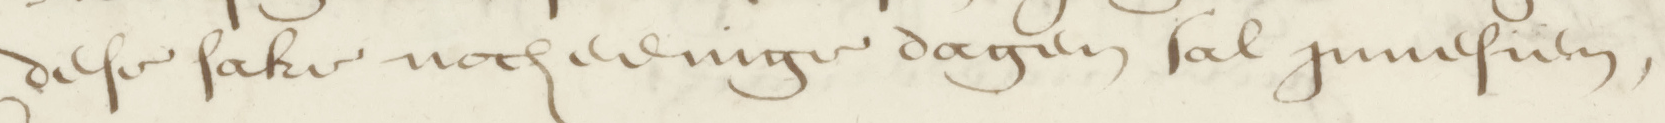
dese sake noch eenige dagen sal Innesien.
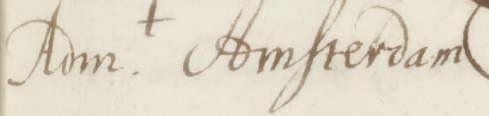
Admt. Amsterdam
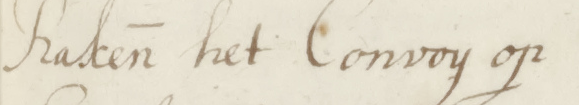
Raken het Convoy op
